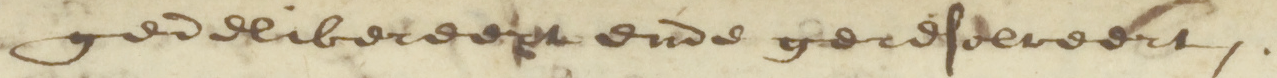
gedelibereert ende geresolveert.
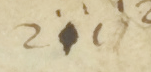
2002
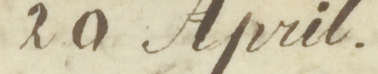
20 April.
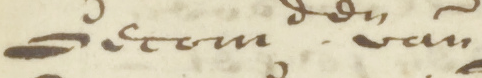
Gecomden van
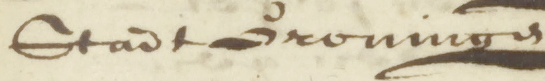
Stadt Groningen
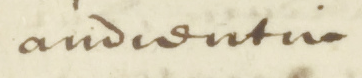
audientie
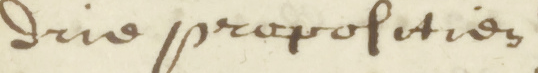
drie propositien
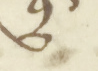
en
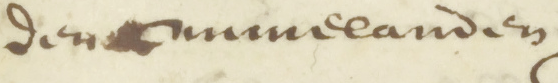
den Ommelanden
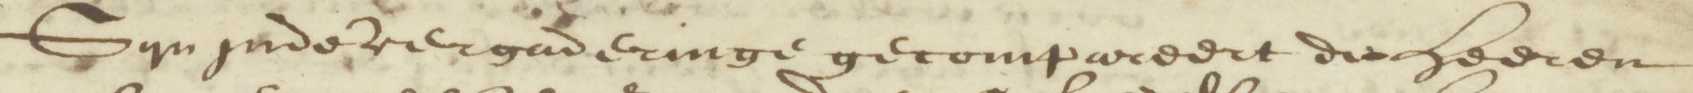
Syn inde vergaderinge gecompareert die Heeren
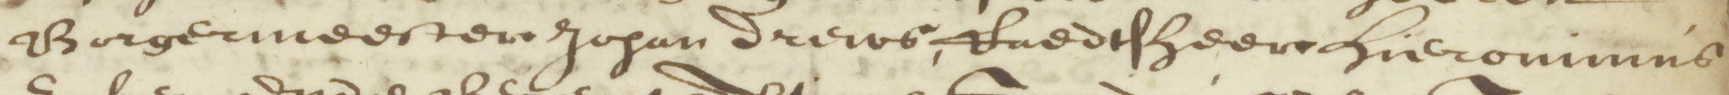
Borgermeester Johan Drews, Raedtsheer Hieronimus
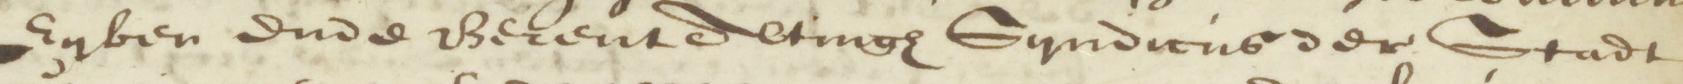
Eyben ende Berent Altingh Syndicus der Stadt
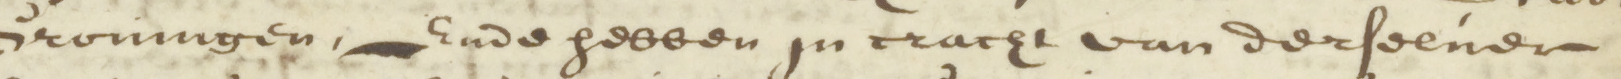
Groningen. Ende hebben in cracht van derselver
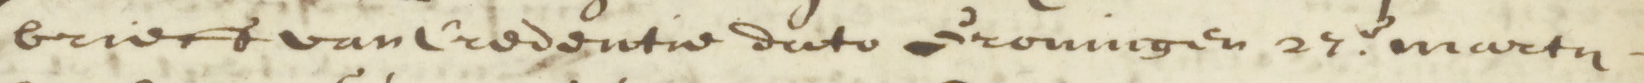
brieff van Credentie dato Groningen 27e marty —
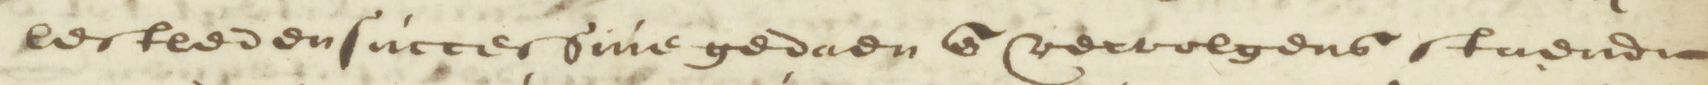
lestleden successive gedaen en vervolgens staende
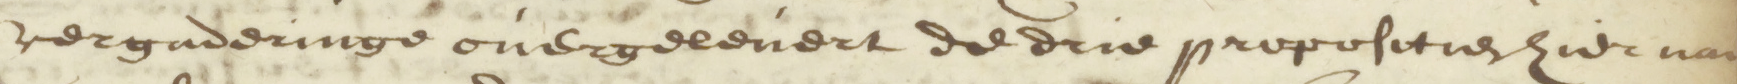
vergaderinge overgelevert de drie propositien hier nae
